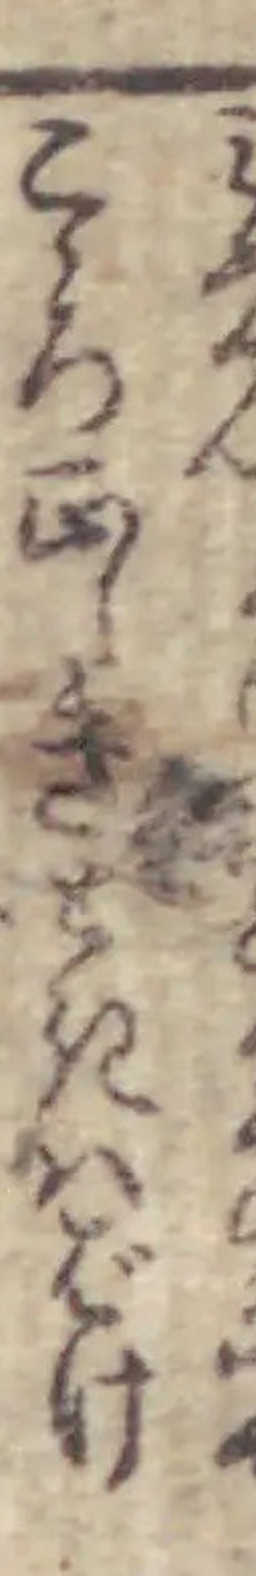こころ正しきときはばけ
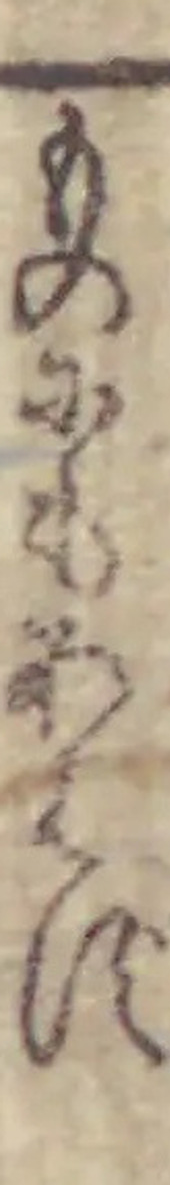ものにもあはず
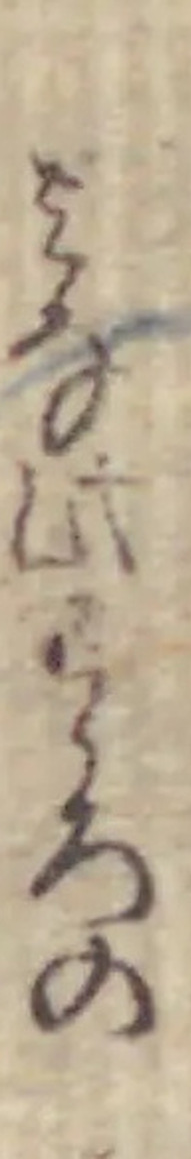みな此こゝろの
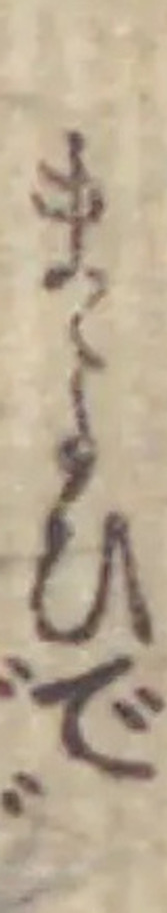まよひで
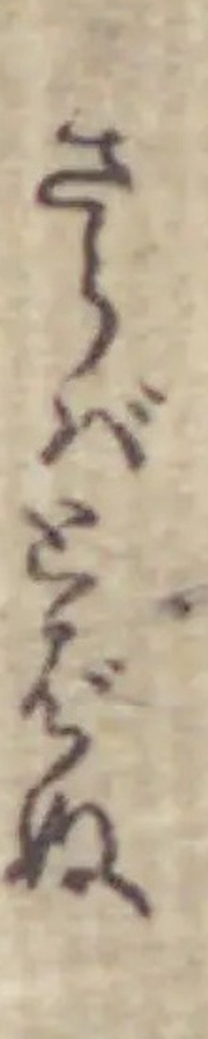さらばとばぬ
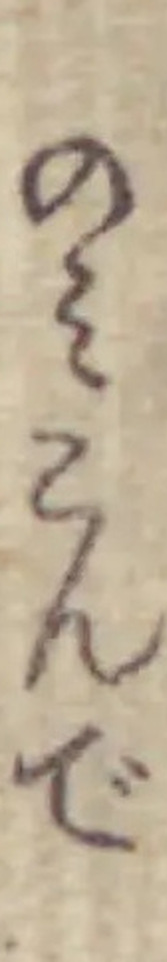のみこんで
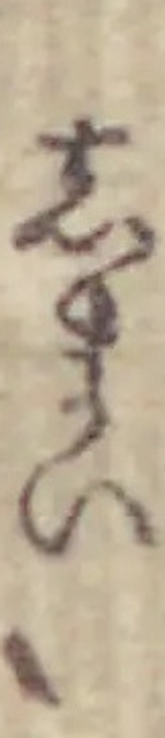しまい
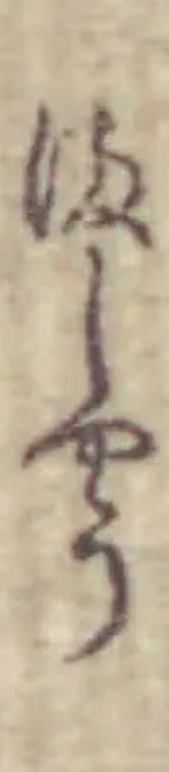ましやう

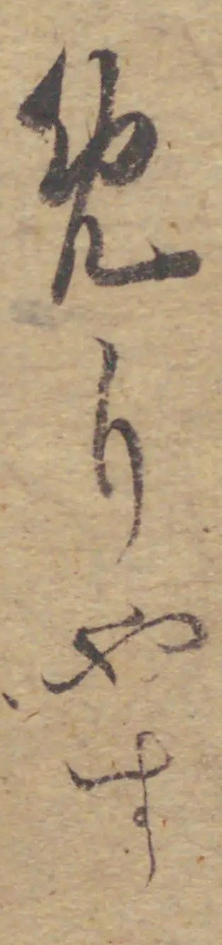めりやす
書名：亀山人家妖 3巻
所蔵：国立国会図書館 National Diet Library, JAPAN
